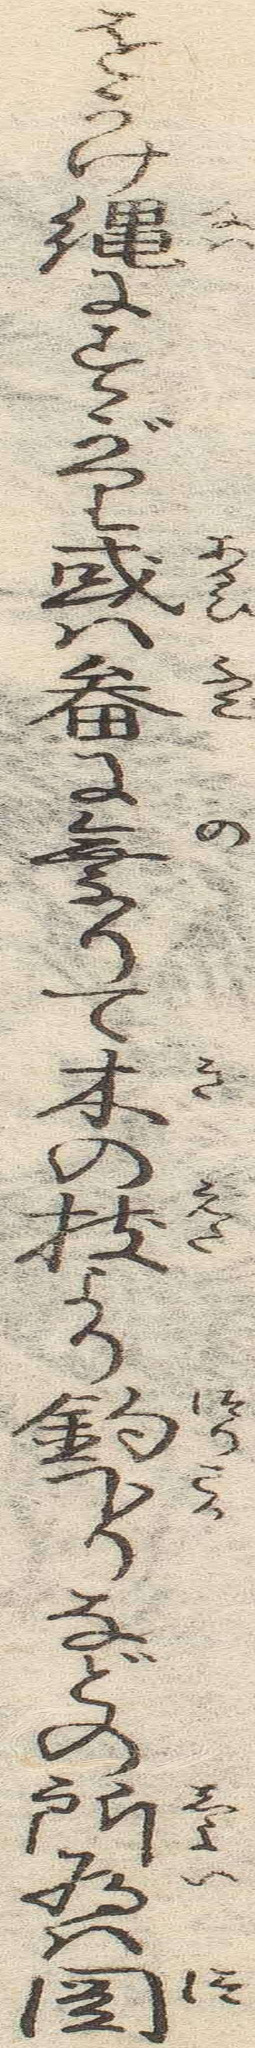をかけ縄にすがり或は畚に乗りて木の枝より釣下りなどの所為は図
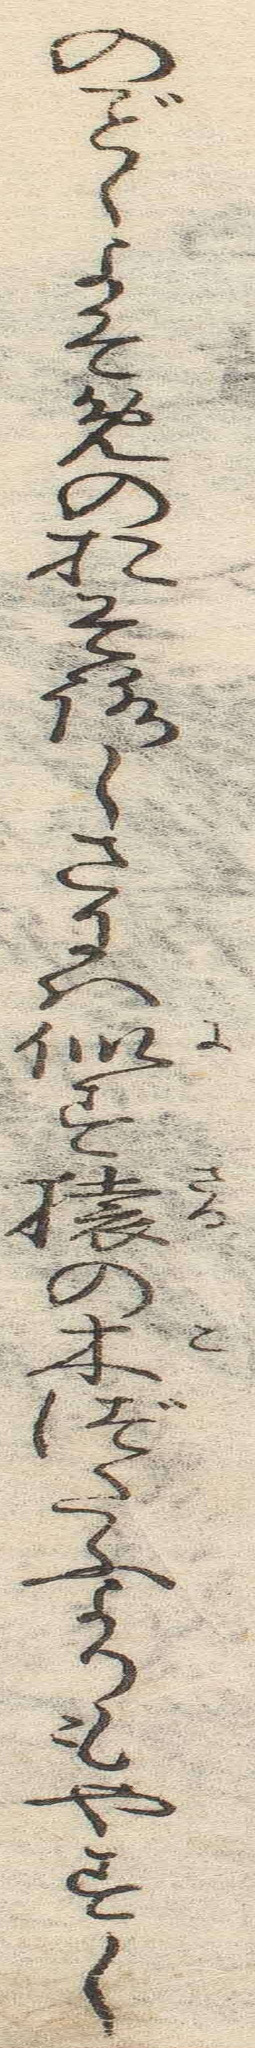のごとしよそめのおそろしさには似す猿の木づたふよりもやすし
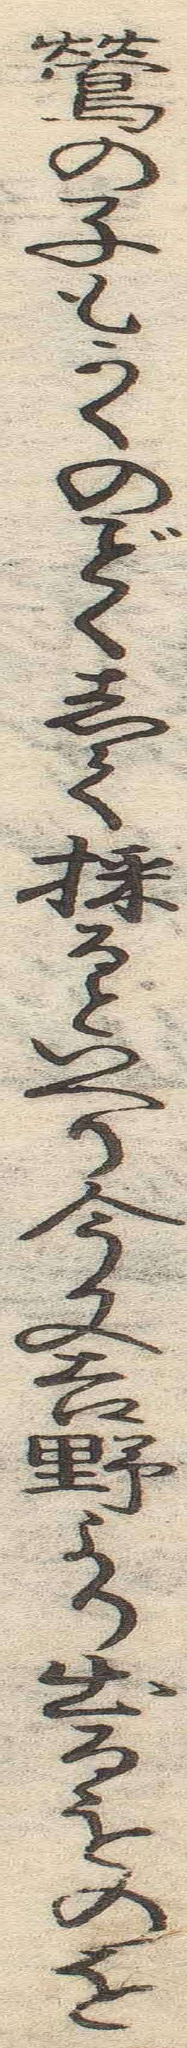鶯の子もかくのごとくして採るといへり今又吉野より出るものを
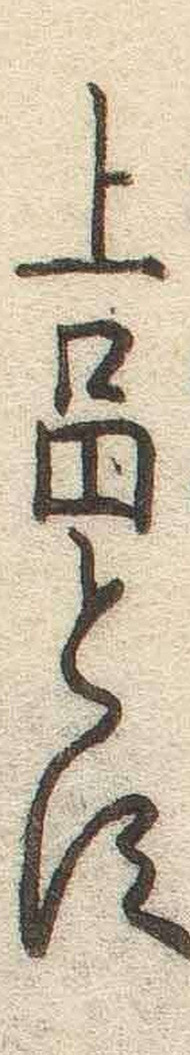上品とす
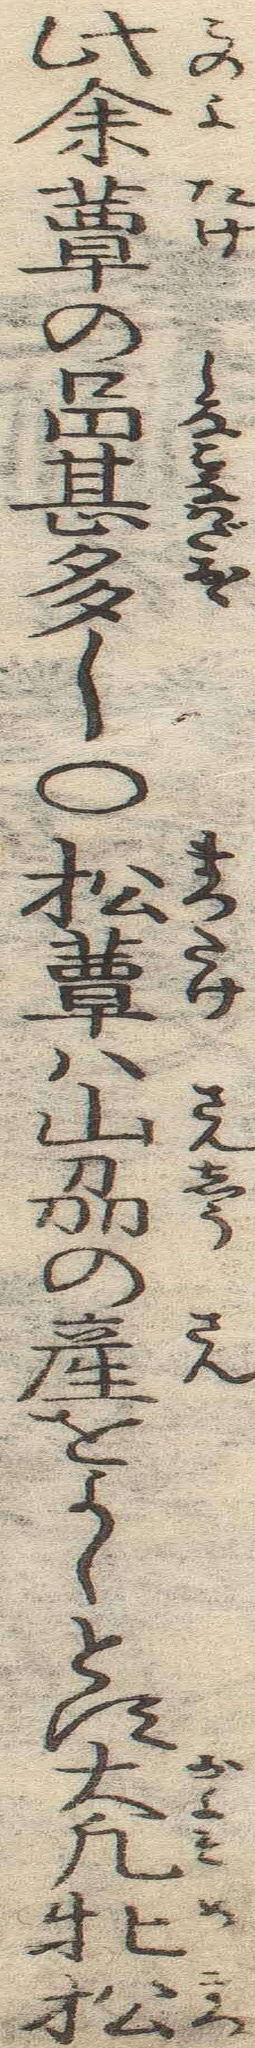此余蕈の品甚多し○松蕈は山州の産をよしとす大凡牝松
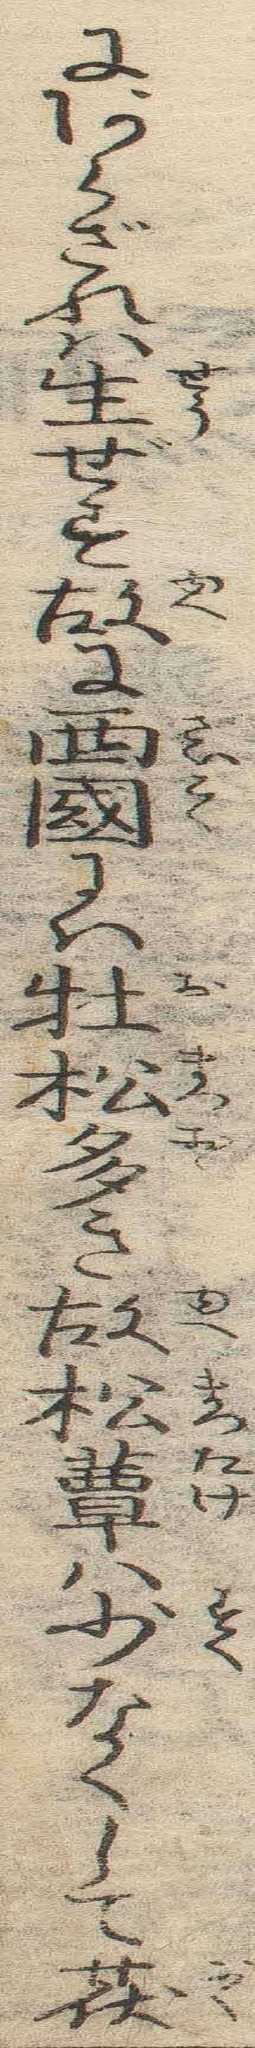にあらざれは生ぜす故に西国には牡松多き故松蕈は少なくして茯

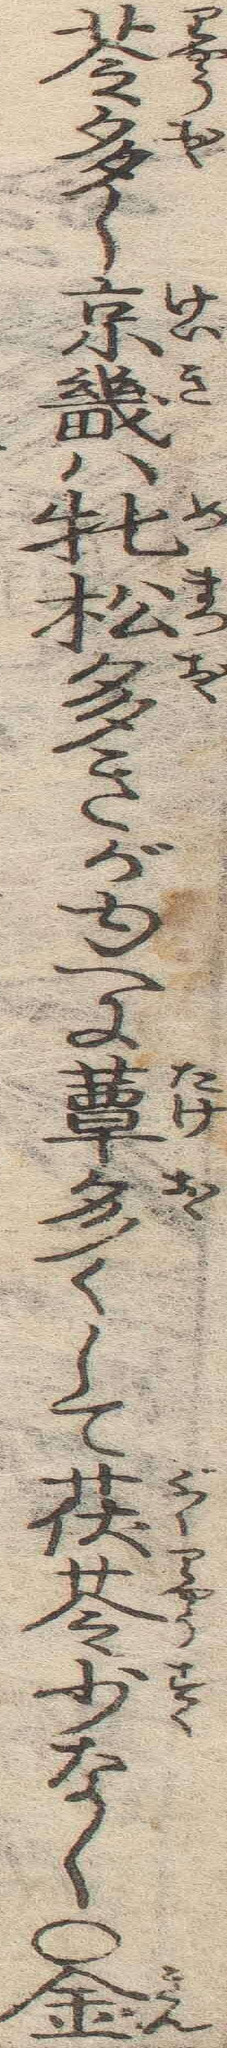苓多し京畿は牝松多きがゆへに蕈多くして茯苓少なし○金
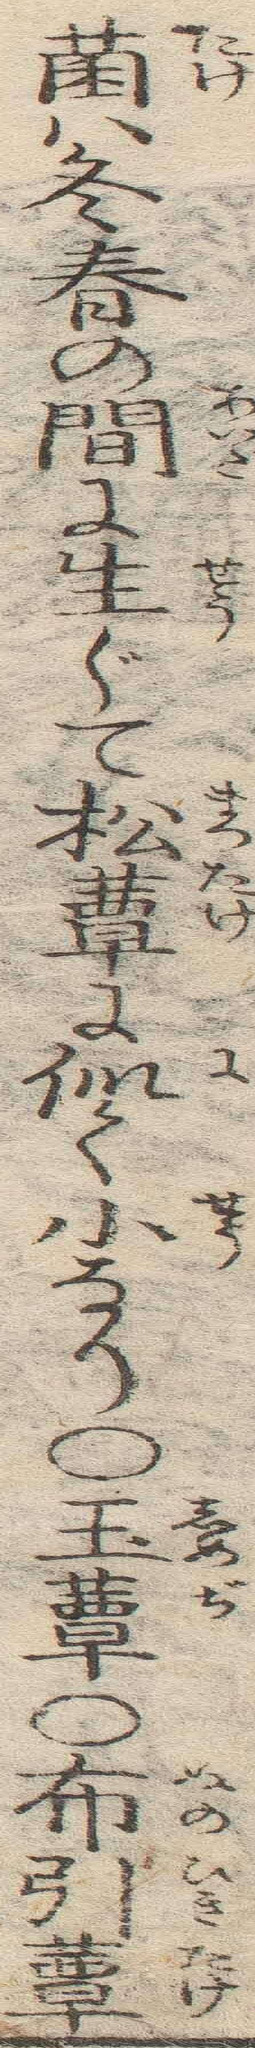菌は冬春の間に生じて松蕈に似て小なり○玉蕈○布引蕈
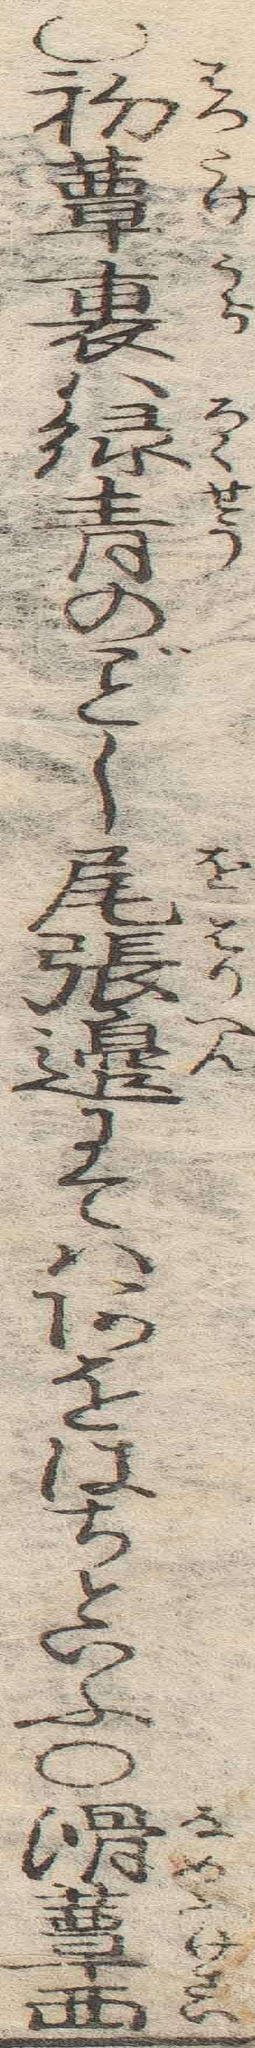○初蕈裏は緑青のごとし尾張辺にてはあをはちといふ○滑蕈西
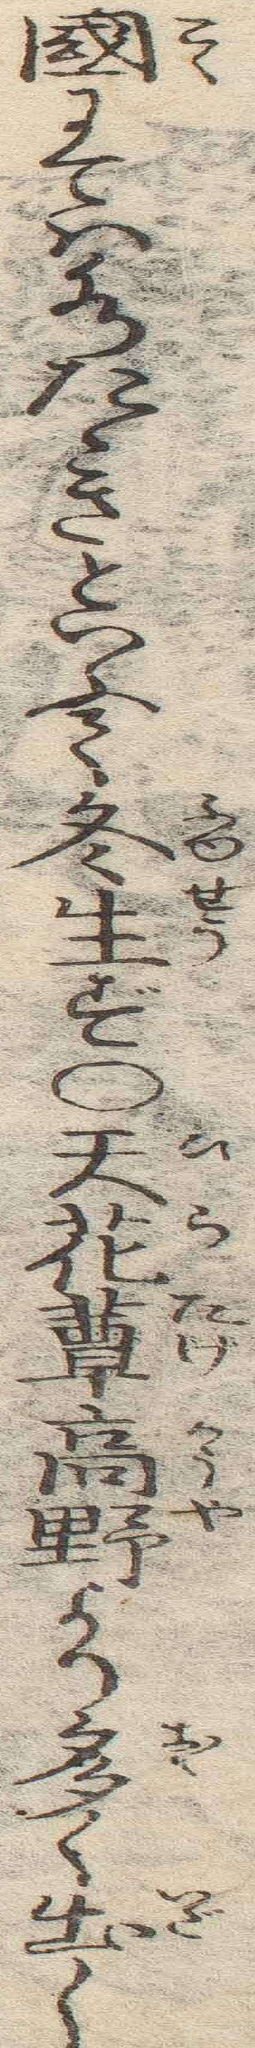国にては水たゝきといふて冬生ず○天花蕈高野より多く出し
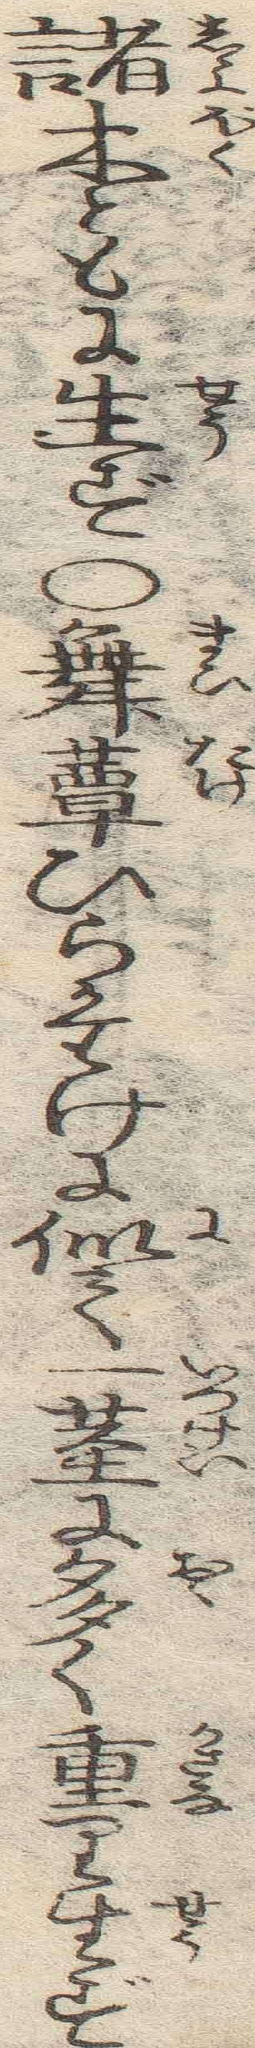諸木ともに生ず○舞蕈ひらたけに似て一茎に多く重り生ず
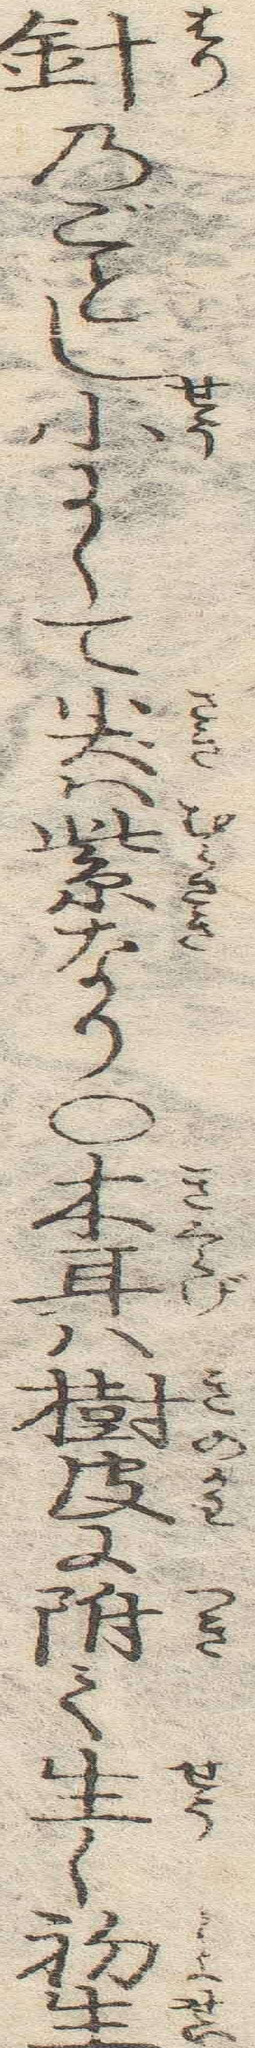針のごとし小にして尖は紫なり○木耳は樹皮に附て生し初生
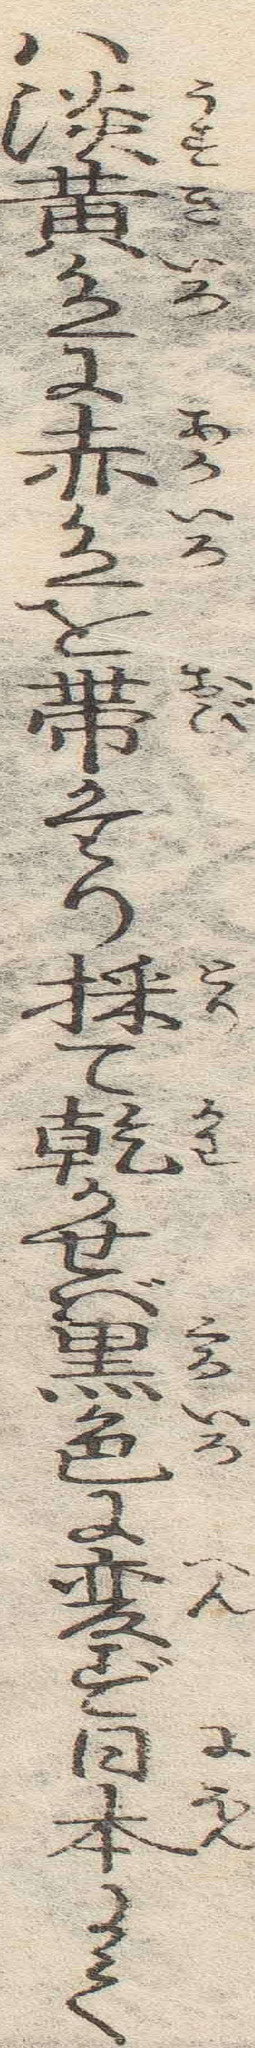は淡黄色に赤色を帯たり採て乾かせば黒色に変ず日本にて
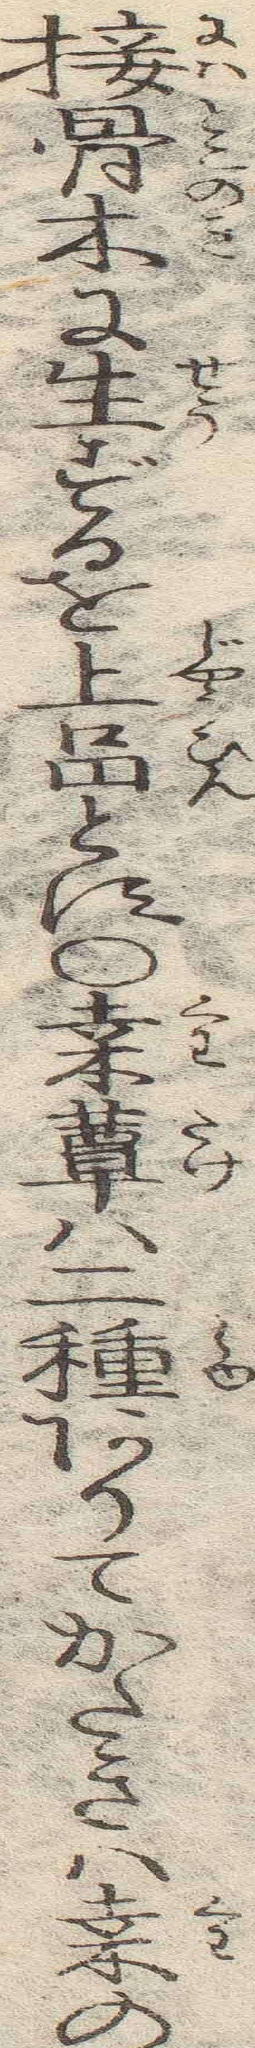接骨木に生ずるを上品とす○桑蕈は二種ありてかたきは桑の
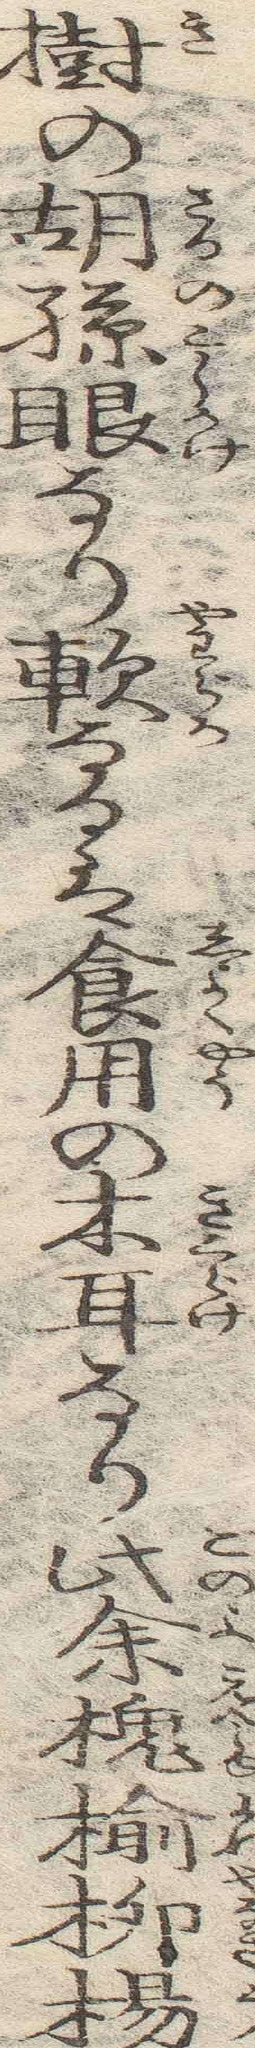樹の胡孫眼なり軟なるは食用の木耳なり此余槐楡柳楊
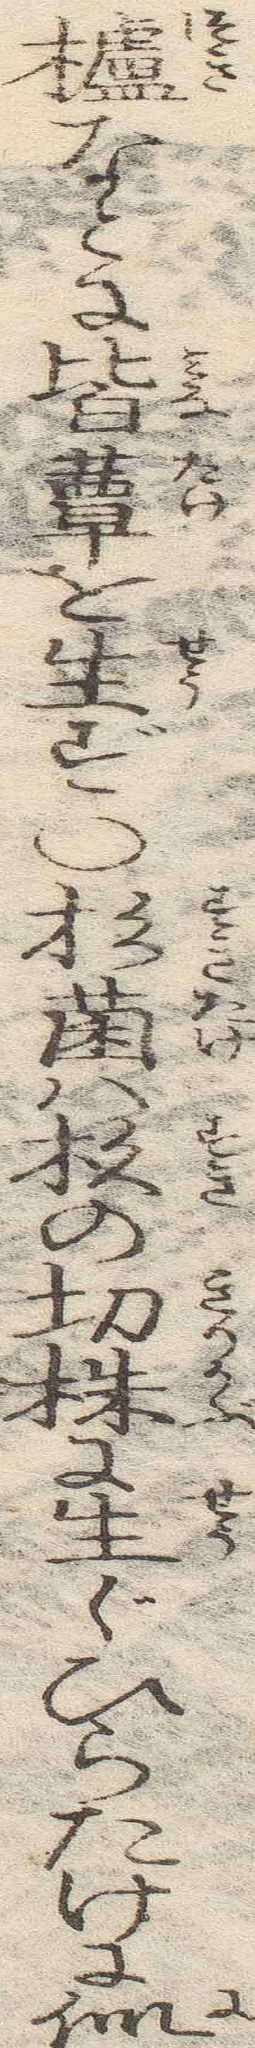櫨なとに皆蕈を生ず○杉蕈は杉の切株に生じひらたけに似
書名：日本山海名産図会
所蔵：東京学芸大学附属図書館 国文学研究資料館
